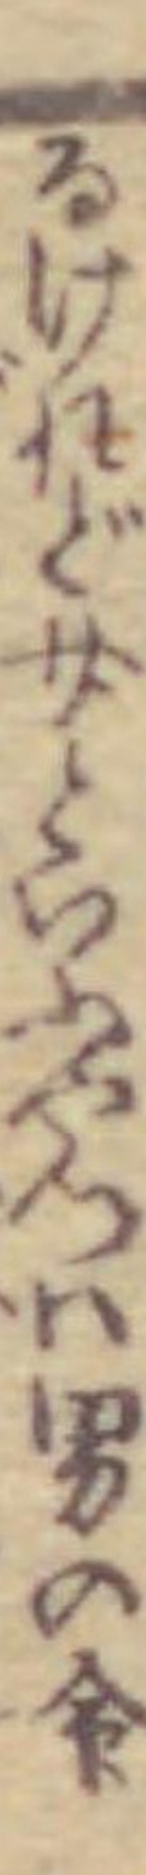るけれど女といふやつは男の舎
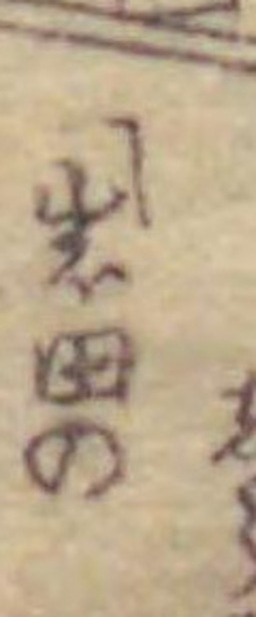〽岩田の
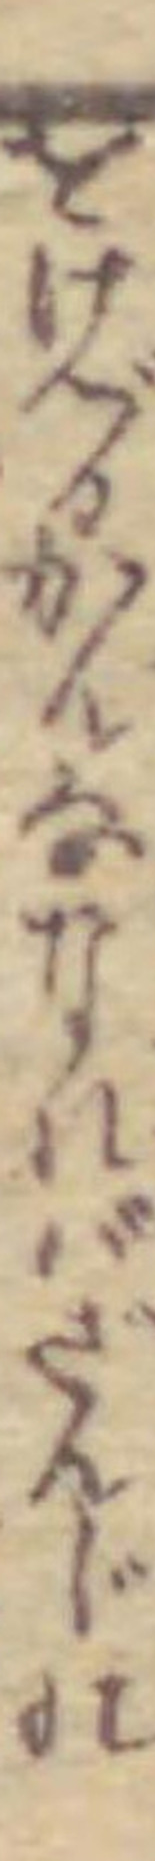をけべるかんななればだんじの
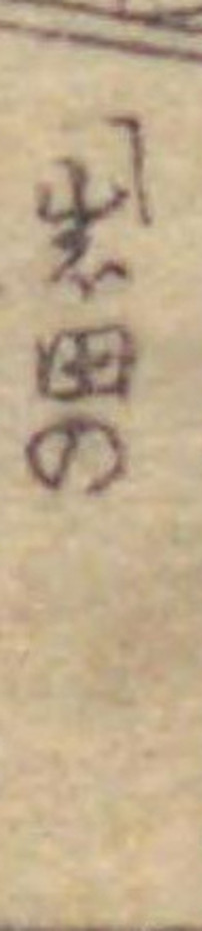〽岩田の
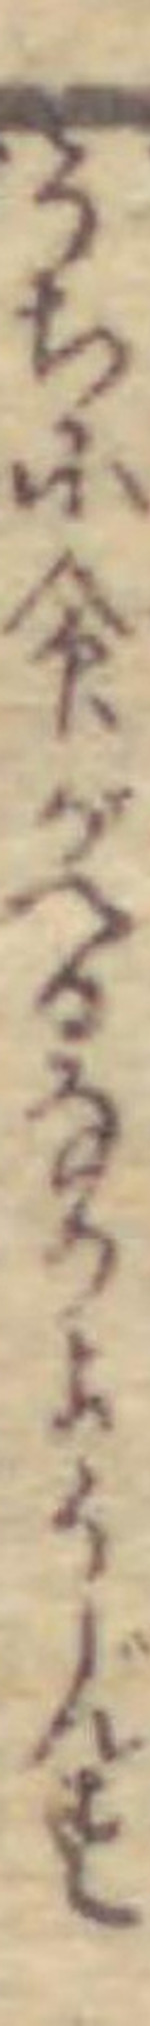うちに命がへるなりようじんす
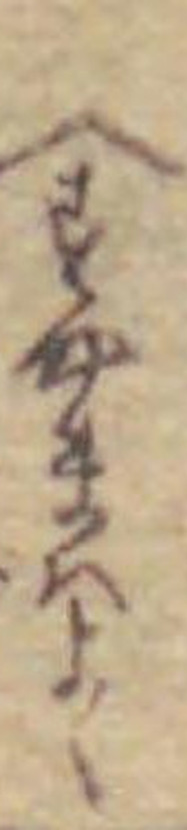〈すやまはよく
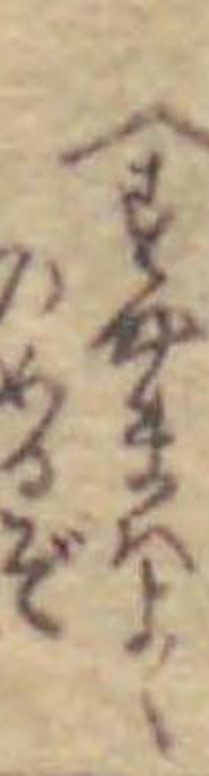のめるぞ
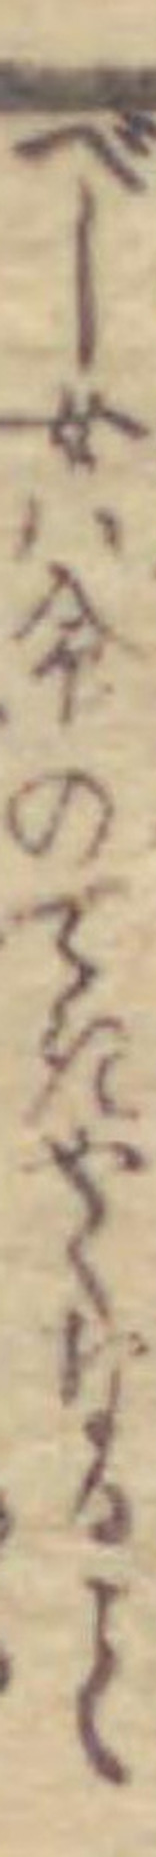べし女は命のてきやくなること
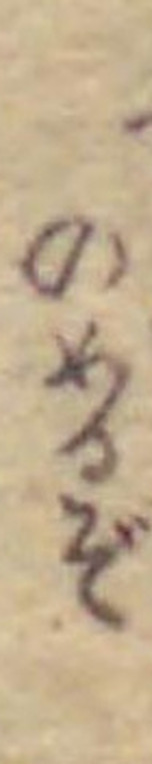のめるぞ
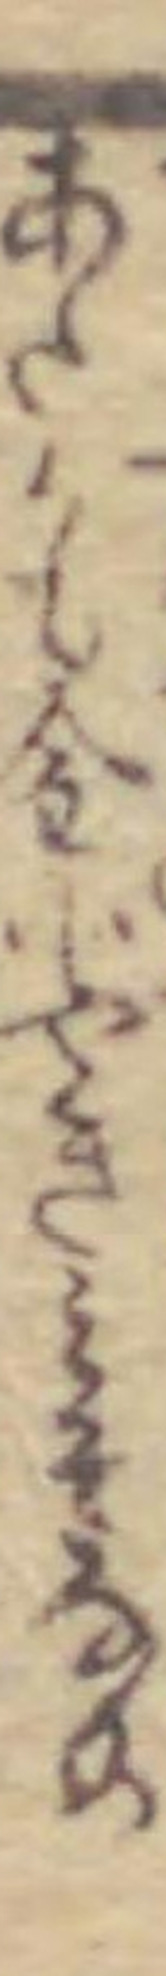あたかも金にやきみそなめ
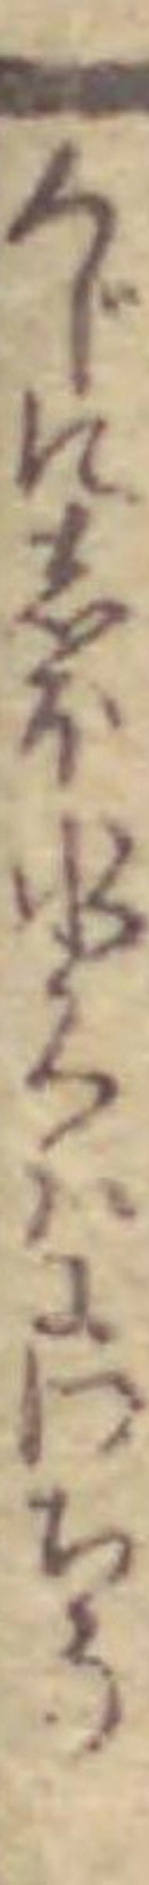くじにしほ水かつはにわちう
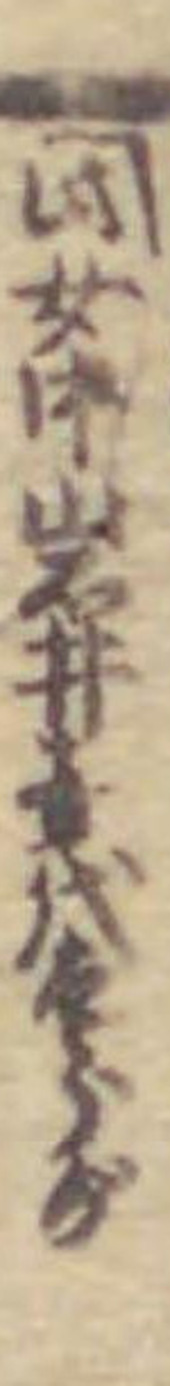〽此女中岩井喜代太郎が
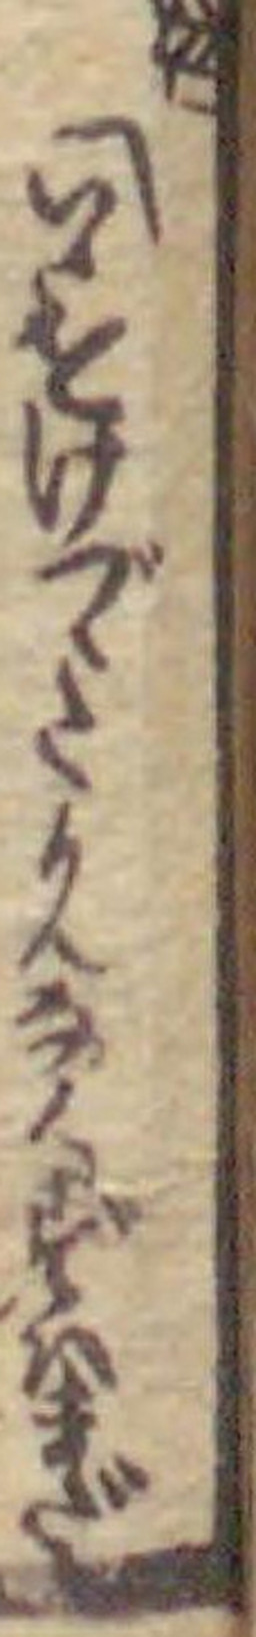〽いたをけづゝたかんなくずはまだ
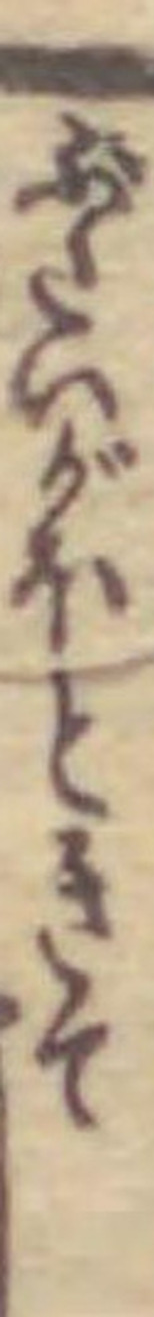ぶたいがほときて
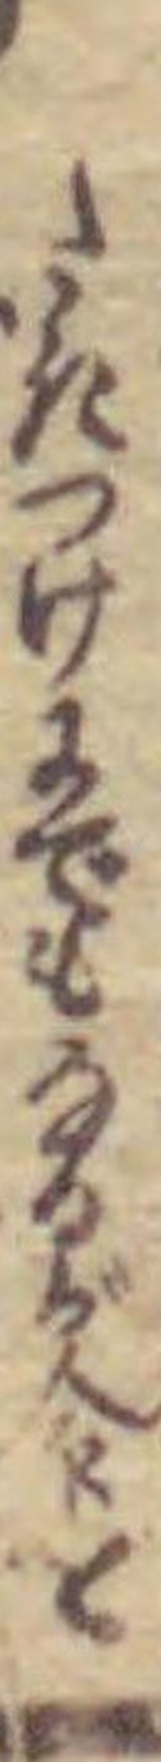たきつけにでもなるが命を
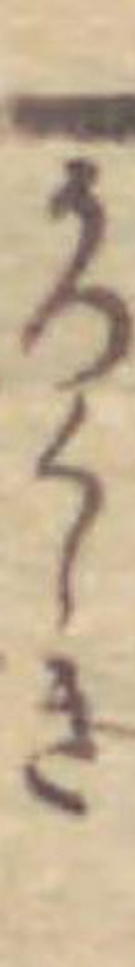うつくしき
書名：御誂染長寿小紋 : 3巻
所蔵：国立国会図書館 National Diet Library, JAPAN
